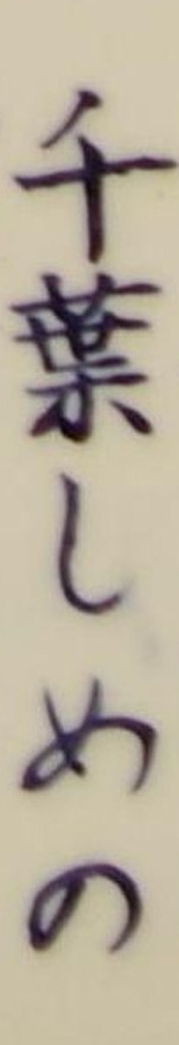千葉しめの
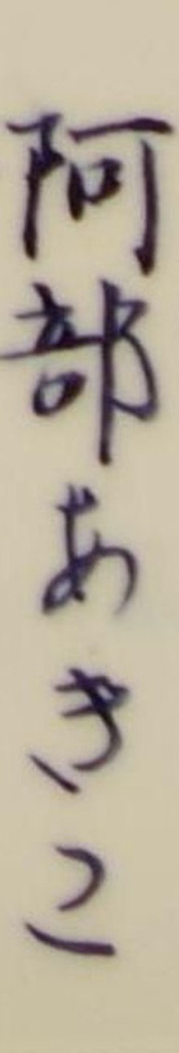阿部あきこ
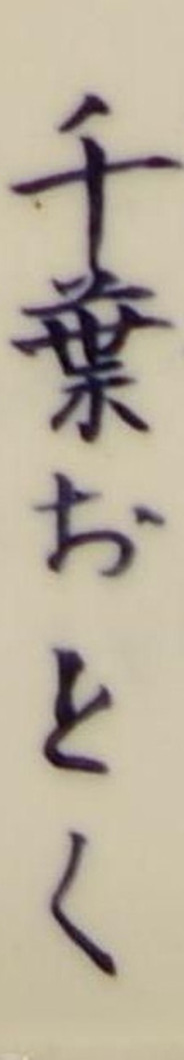千葉おとく
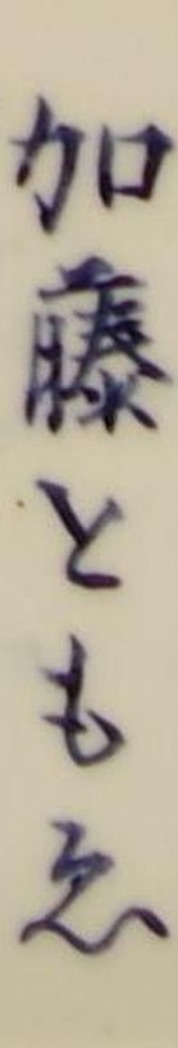加藤ともゑ
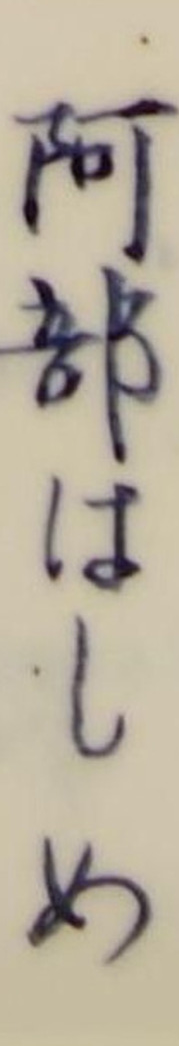阿部はしめ
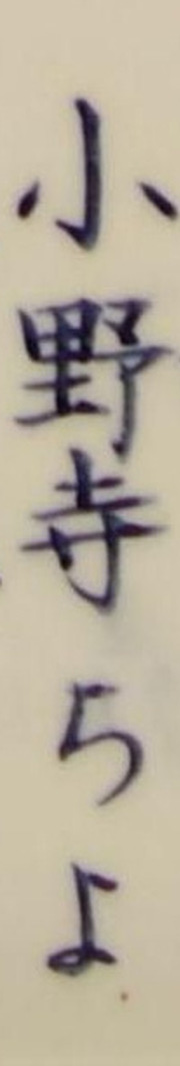小野寺ちよ
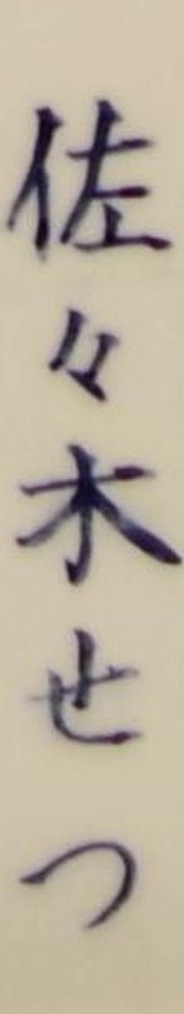佐々木せつ
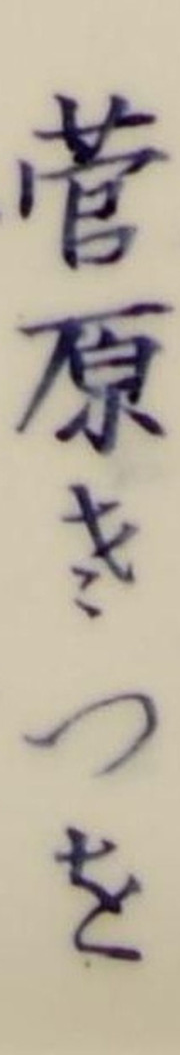菅原きつを
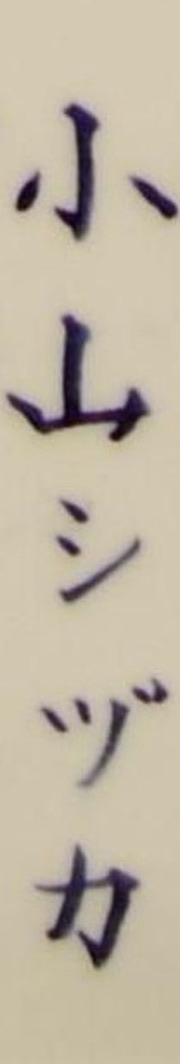小山シヅカ
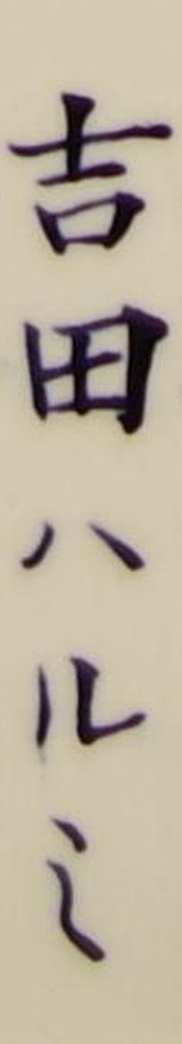吉田ハルミ
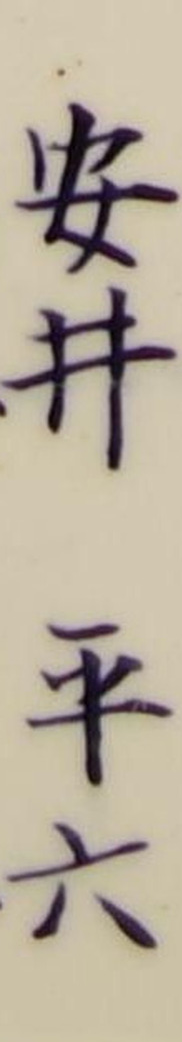安井平六
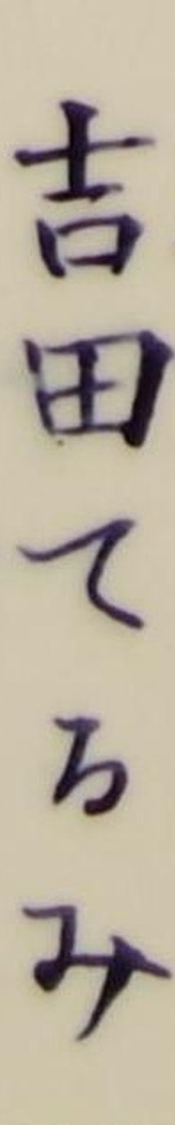吉田てるみ
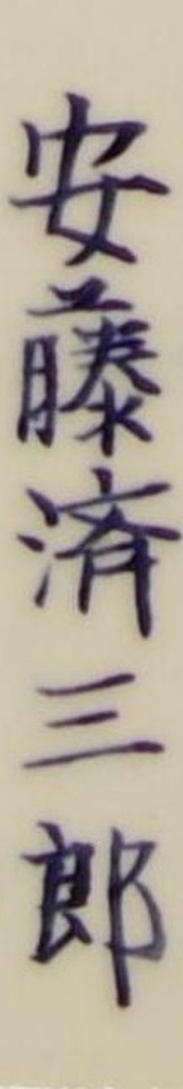安藤済三郎
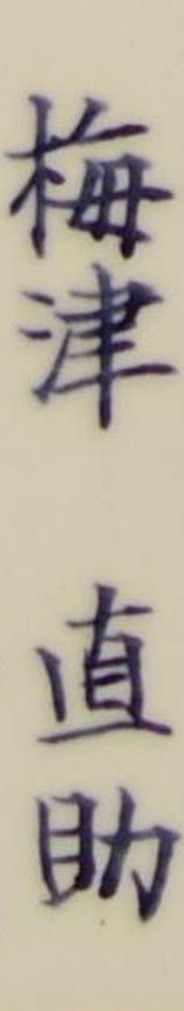梅津直助
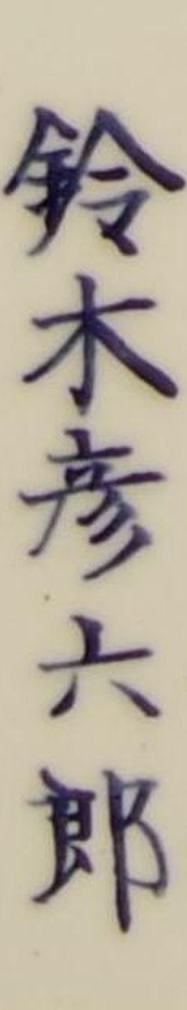鈴木彦六郎
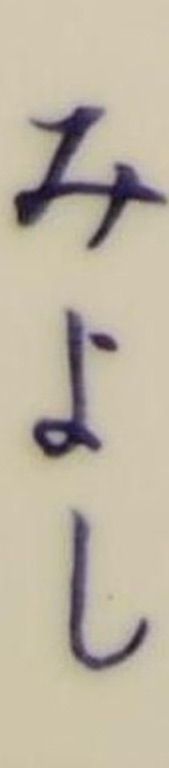みよし
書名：A~D
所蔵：koyasan kongobuji
